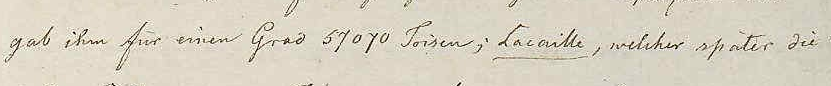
gab ihm für einen Grad 57070 Toisen; Lacaille, welcher später die-
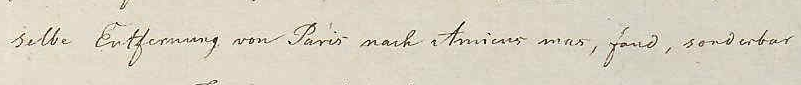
selbe Entfernung von Paris nach Amiens mas, fand, sonderbar
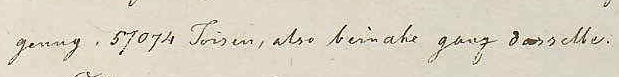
genug, 57074 Toisen, also beinahe ganz dasselbe.
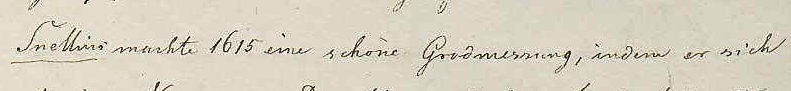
Snellius machte 1615 eine schöne Gradmessung, indem er sich
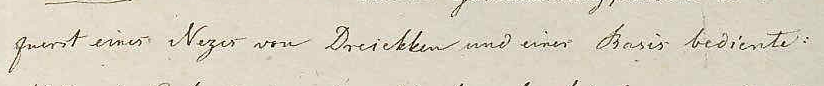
zuerst eines Nezes von Dreiekken und einer Basis bediente:
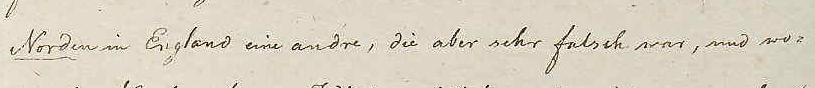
Norden in England eine andre, die aber sehr falsch war, und wo-
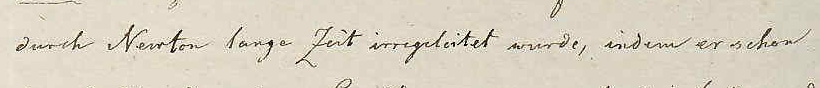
durch Newton lange Zeit irregeleitet wurde, indem er schon
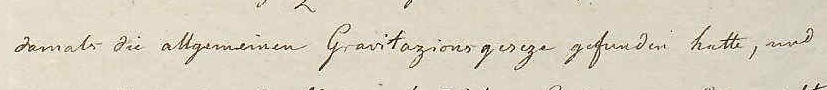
damals die allgemeinen Gravitazionsgeseze gefunden hatte, und
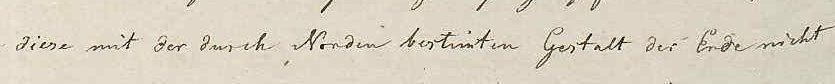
diese mit der durch Norden bestimten Gestalt der Erde nicht
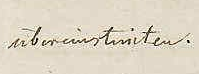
übereinstimten.
